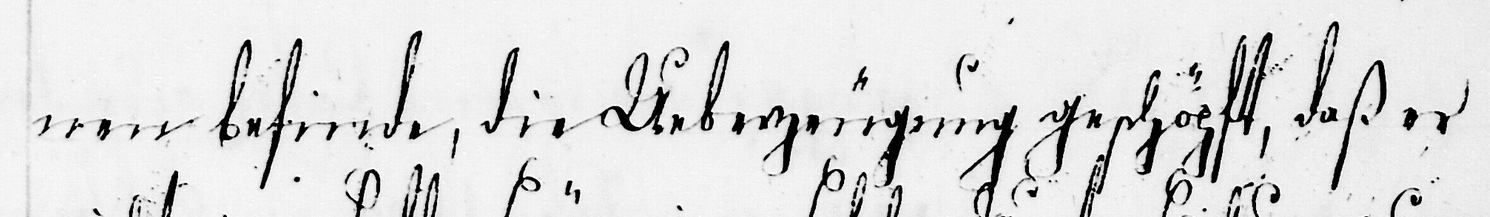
nen befinde, die Ueberzeugung geschöpft, daß er
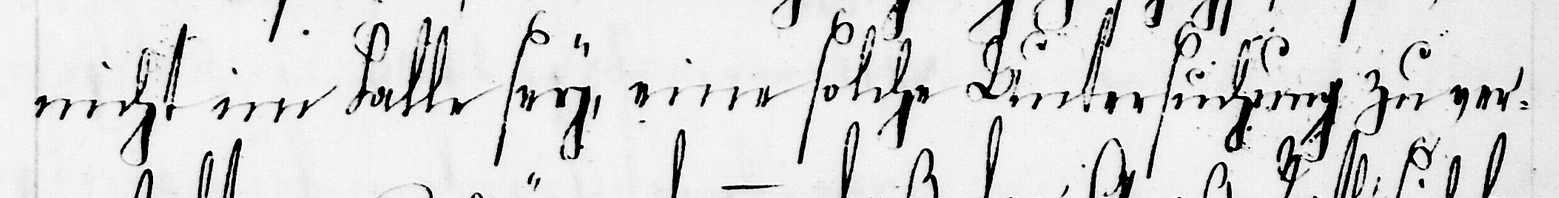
nicht im Falle sey, eine solche Untersuchung zu ver¬
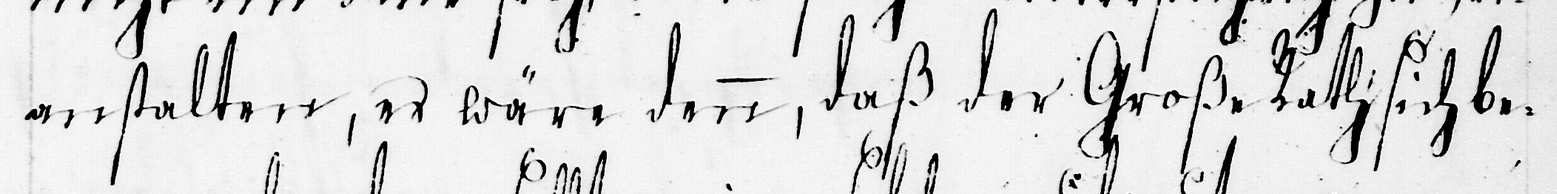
anstalten, es wäre denn, daß der Große Rath sich be¬
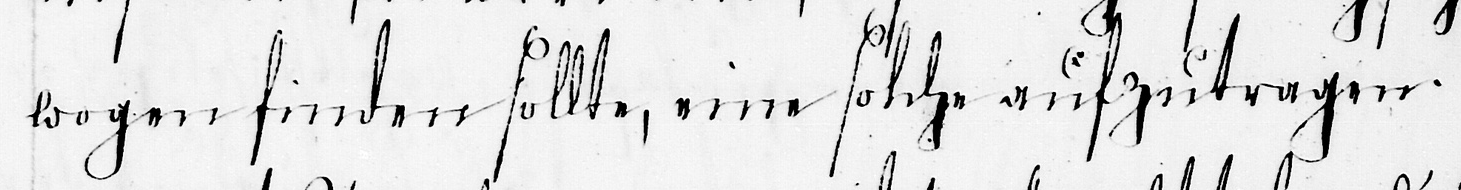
wogen finden sollte, eine solche aufzutragen.
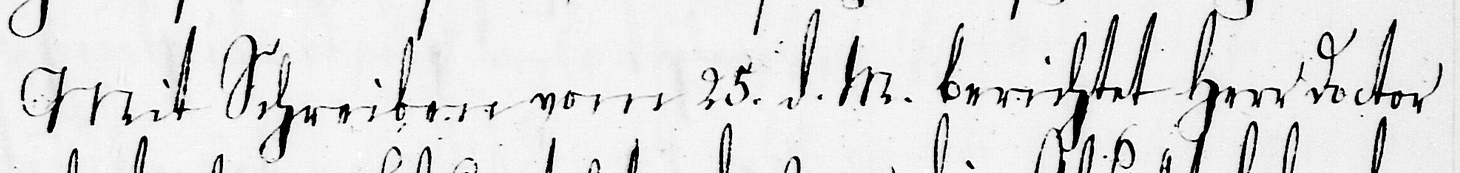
Mit Schreiben vom 25. d. M. berichtet Herr Doctor
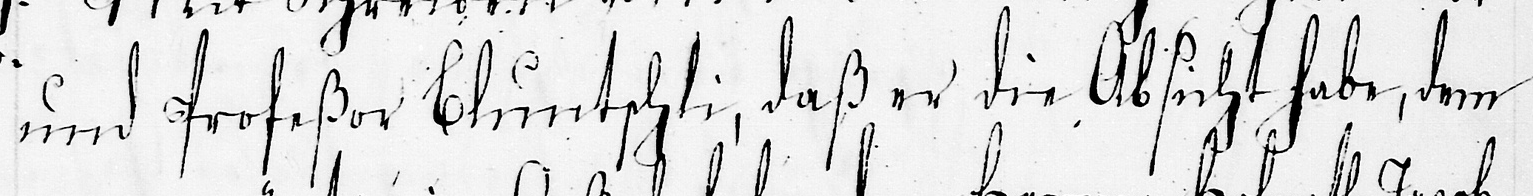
und Profeßor Bluntschli, daß er die Absicht habe, dem
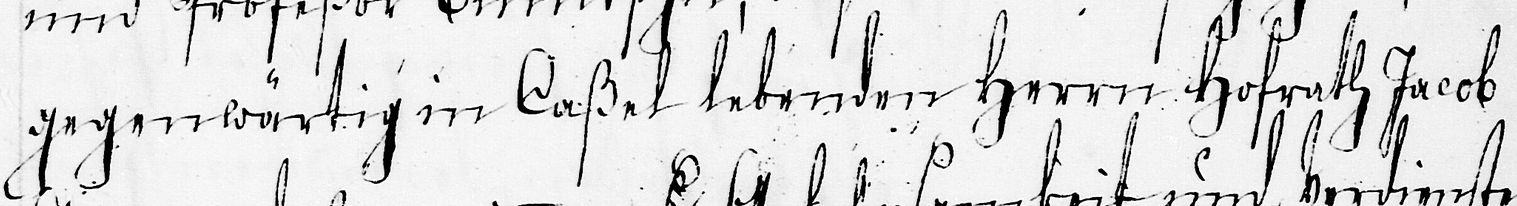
gegenwärtig in Caßel lebenden Herrn Hofrath Jacob
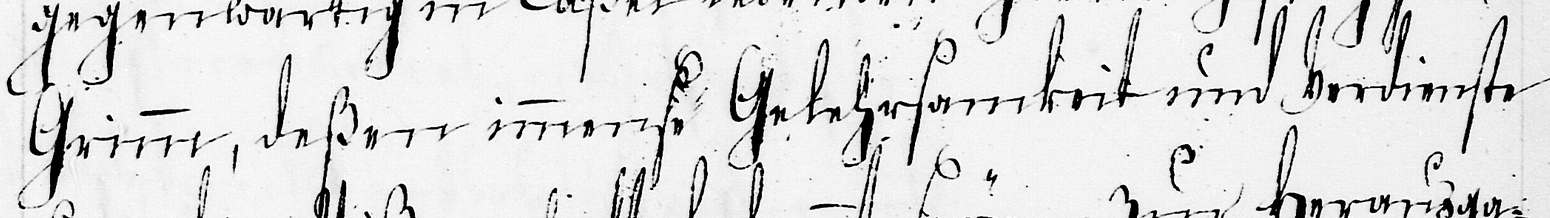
Grimm, deßen immense Gelehrsamkeit und Verdienste
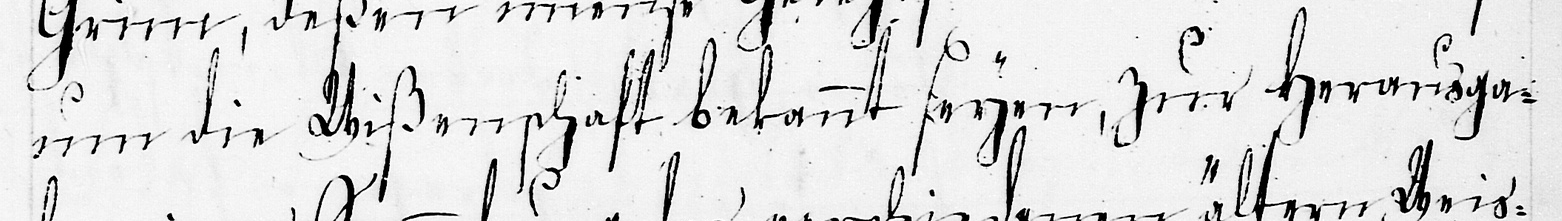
um die Wißenschaft bekannt seyen, zur Herausga¬
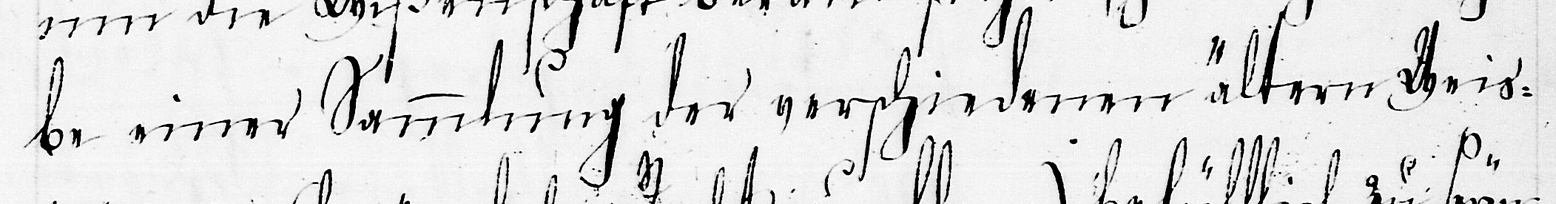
be einer Sammlung der verschiedenen ältern Weis¬
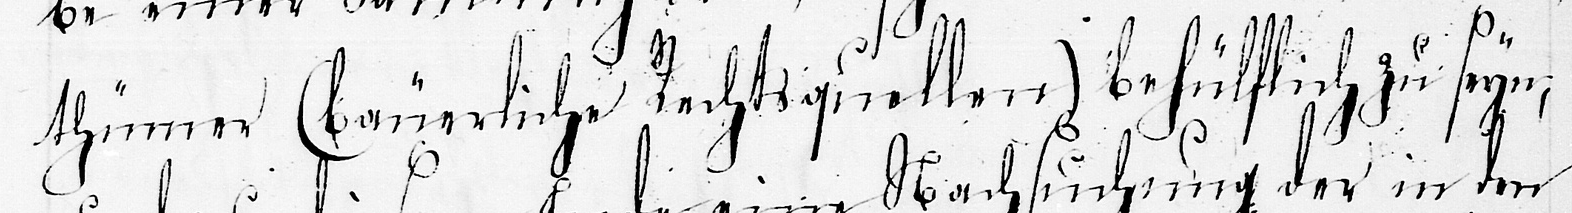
thümer (bäuerliche Rechtsquellen) behülflich zu seyn;
